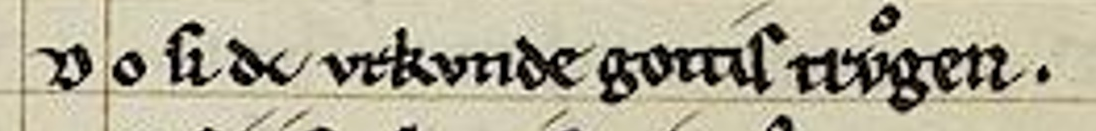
Do ſi d(az) vrkvnde gottiſ trv°ogen.
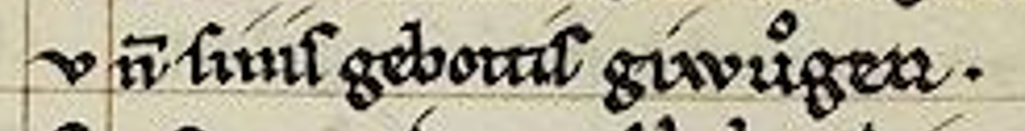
Vn(d) ſiniſ gebottiſ giwu°ogen.
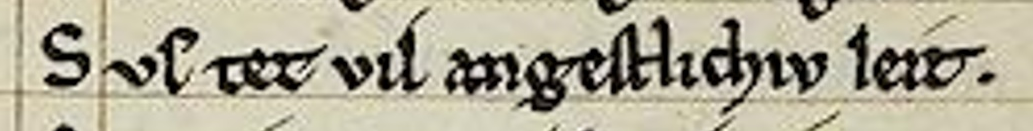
Svſ tet vil angeſtlichiv leit.
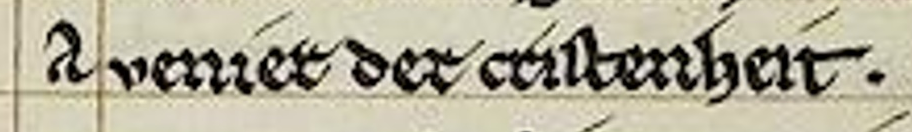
Avenier der criſtenheit.
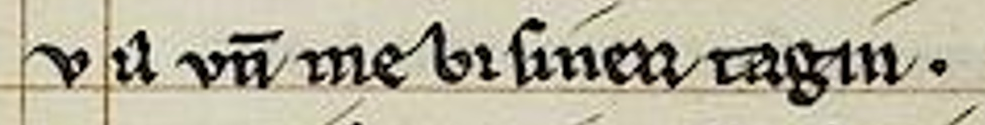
Vil vn(d) me bi ſinen tagin.
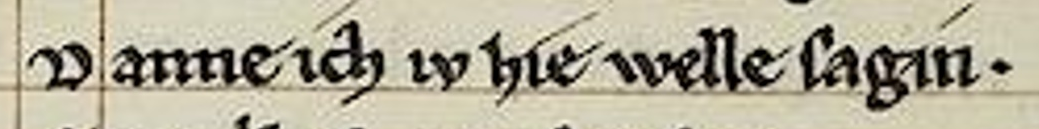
Danne ich iv hie welle ſagin.
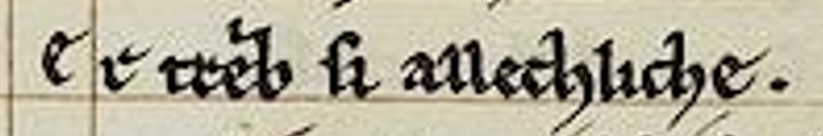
Er treb ſi allechliche.
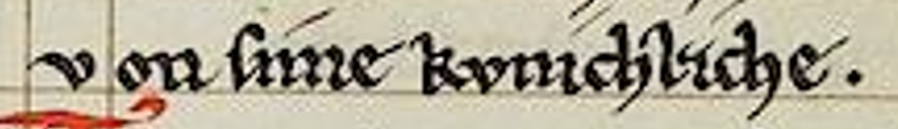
Von ſime kvnichliche.
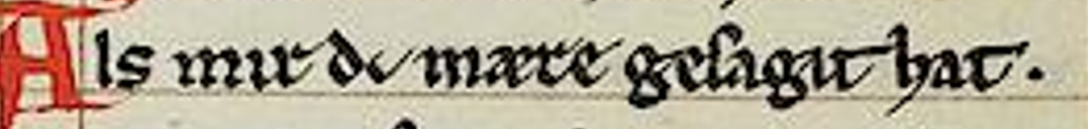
*Als mir d(az) m[ae]re geſagit hat.
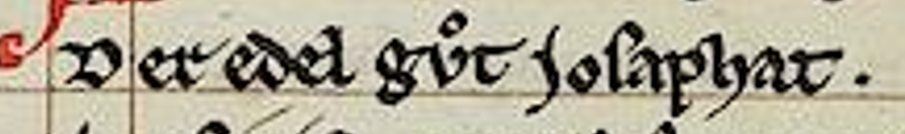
Der edel gv°ot Josaphat.
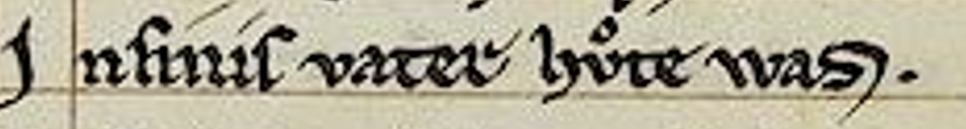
Inſiniſ vater hv°ote was.
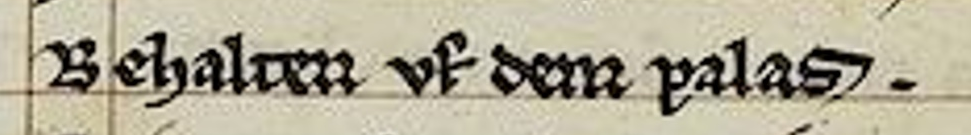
Behalten vf dem palas.
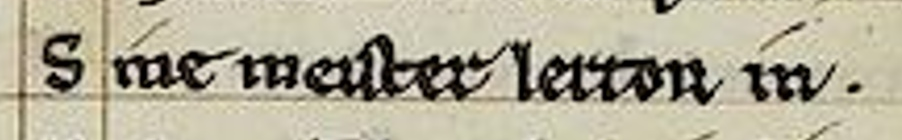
Sine meiſter lerton in.
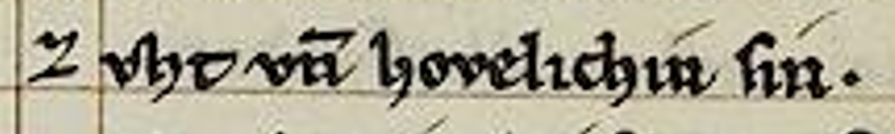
Zvht vn(d) hovelichin ſin.
